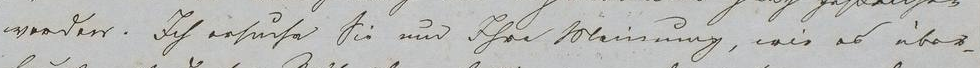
werden. Ich ersuche Sie um Ihre Meinung, wie es über-
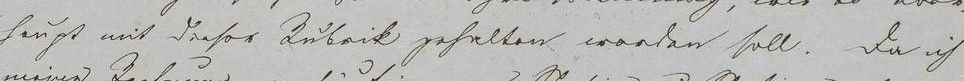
haupt mit dieser Rubrik gehalten werden soll. Da ich
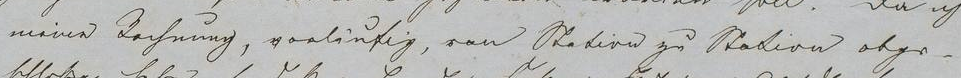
meine Rechnung, vorläufig, von Station zu Station abge-
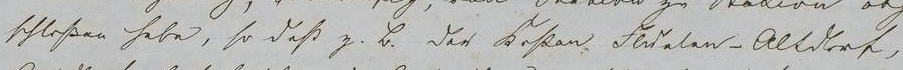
schloßen habe, so daß z. B. die Kosten Flüelen–Altdorf,
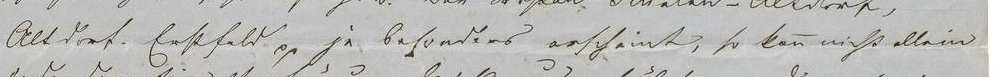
Altdorf–Erstfeldpp je besonders erscheint, so kann nicht allein
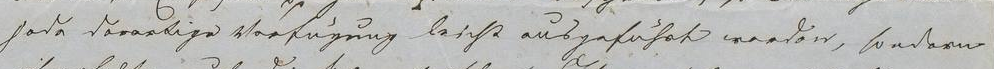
jede derartige Verfügung leicht ausgeführt werden, sondern
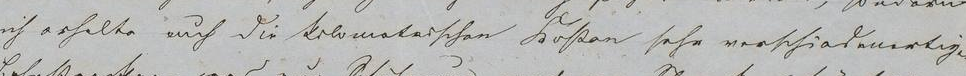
ich erhalte auch die kilometischen Kosten sehr verschiedenartiger
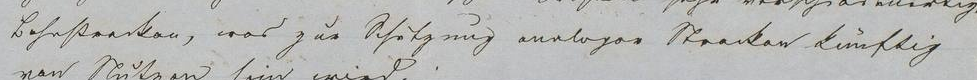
Bohrstrecken, was zur Schätzung analoger Strecken künftig
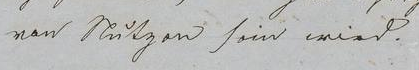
von Nutzen sein wird.
